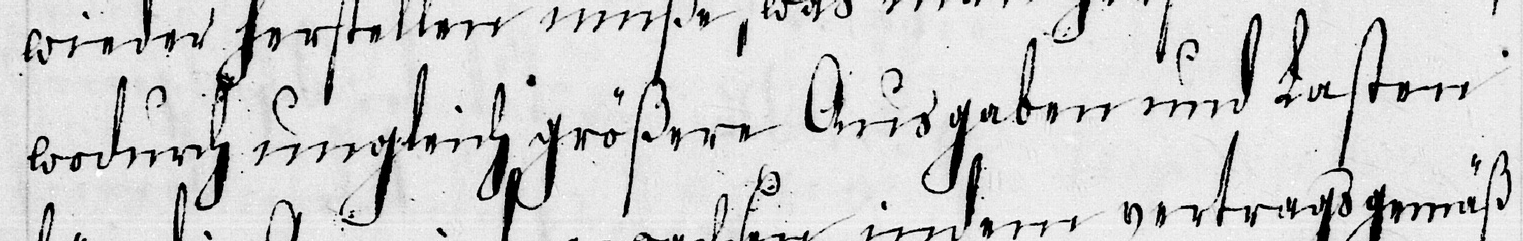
wodurch ungleich größere Ausgaben und Lasten
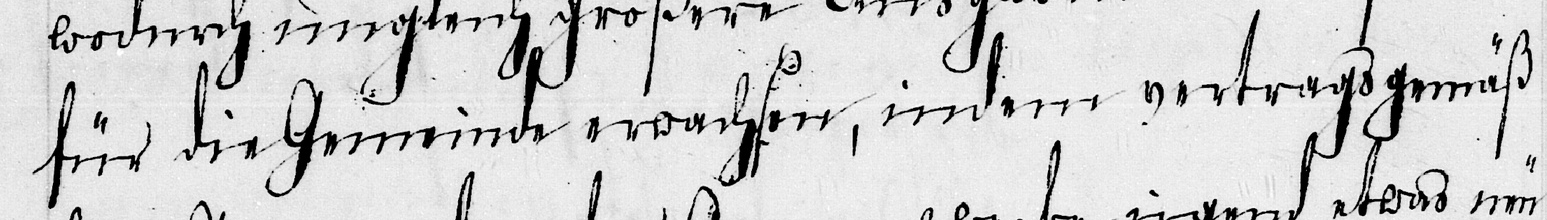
für die Gemeinde erwachsen, indem vertragsgemäß
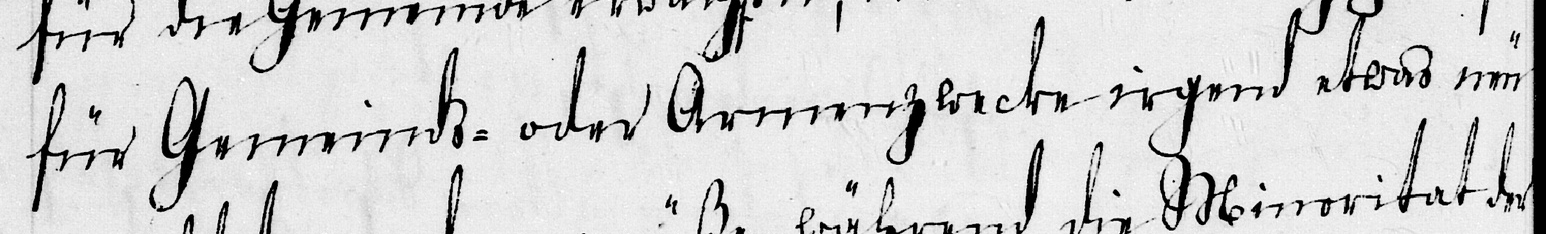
für Gemeinds- oder Armenzwecke irgend etwas neu
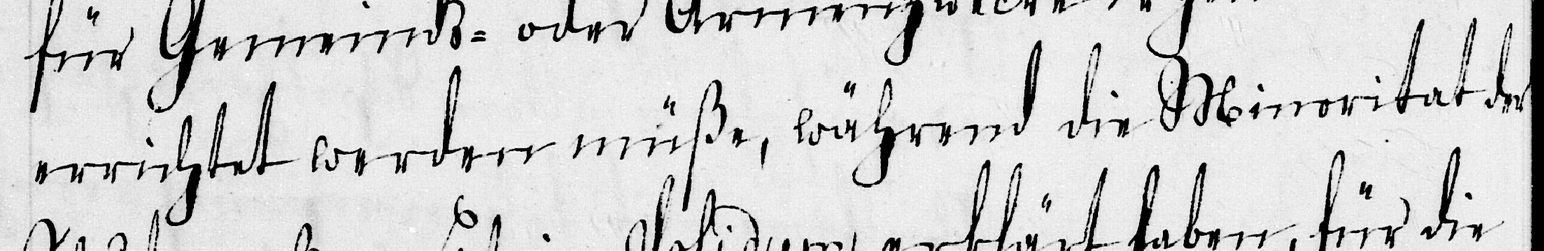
errichtet werden müße, während die Minoritat der
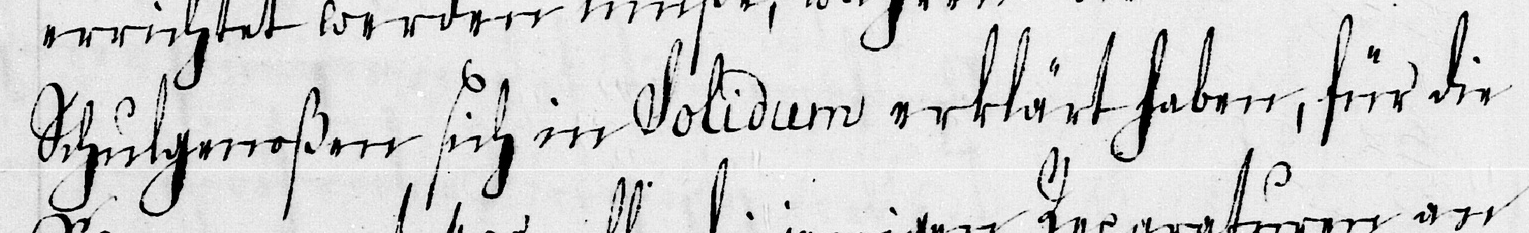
Schulgenoßen sich in Solidum erklärt haben, für die
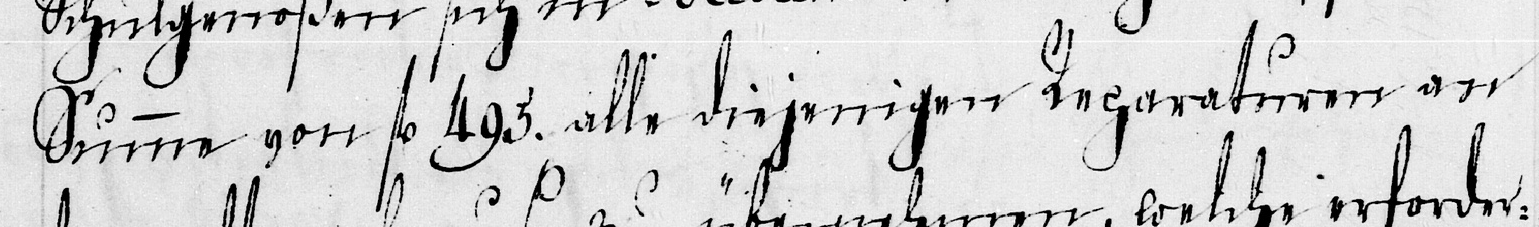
Summe von fl. 495. alle diejenigen Reparaturen an
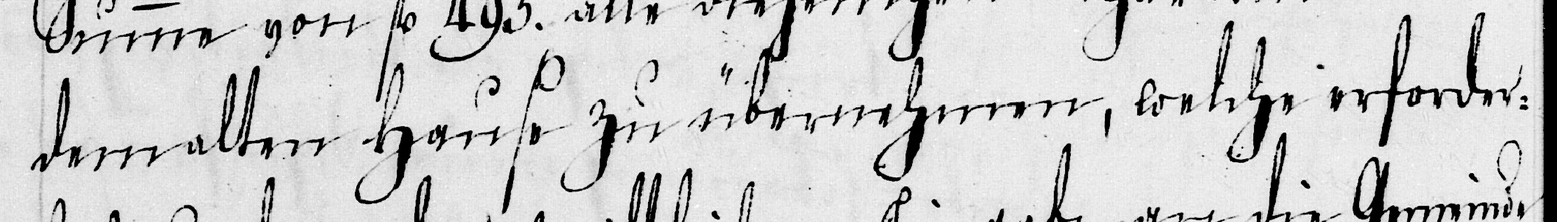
dem alten Hause zu übernehmen, welche erforder¬
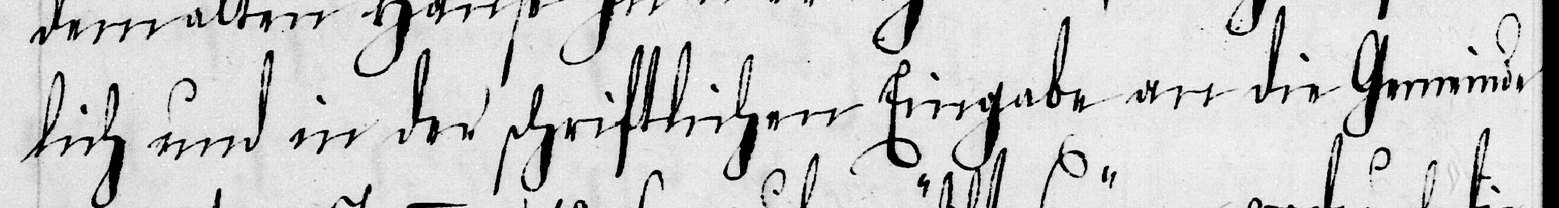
lich und in der schriftlichen Eingabe an die Gemeinde
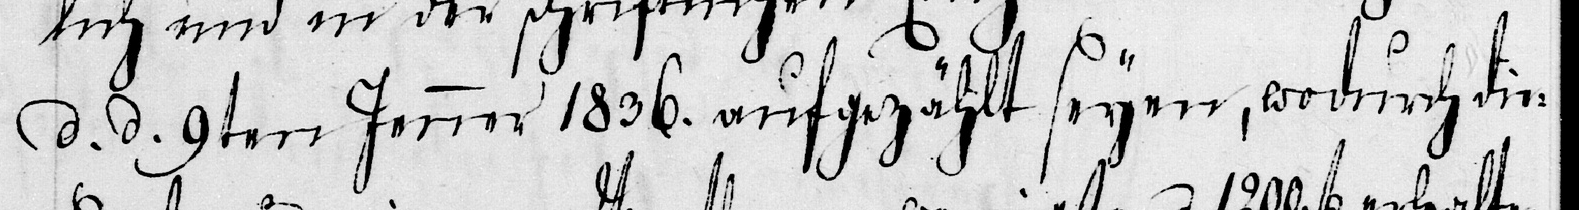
d. d. 9ten Jenner 1836. aufgezählt seyen, wodurch die¬
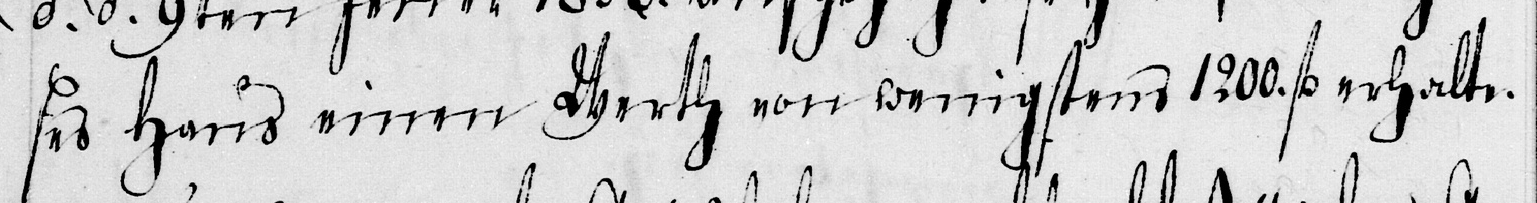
ses Haus einen Werth von wenigstens 1200. fl. erhalte.
